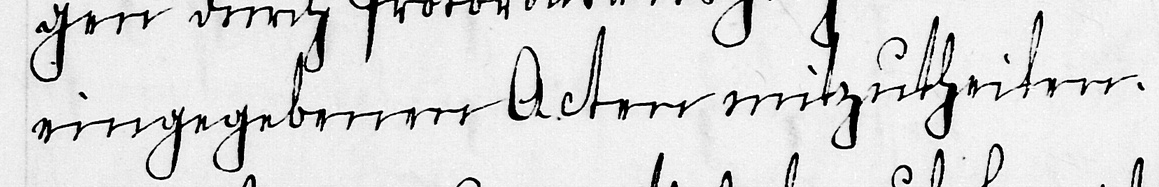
eingegebenen Acten mitzutheilen.
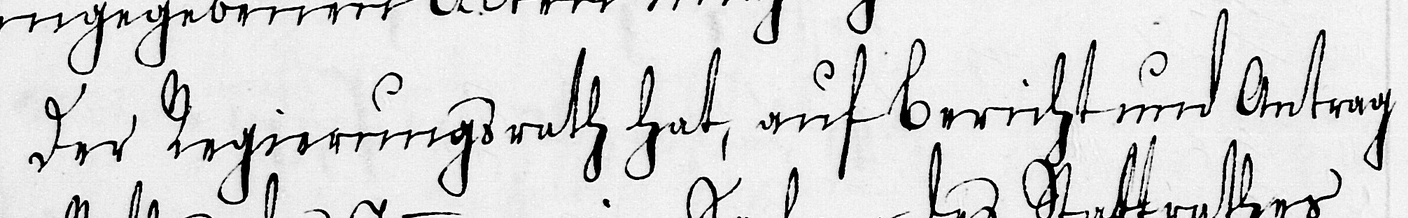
Der Regierungsrath hat, auf Bericht und Antrag
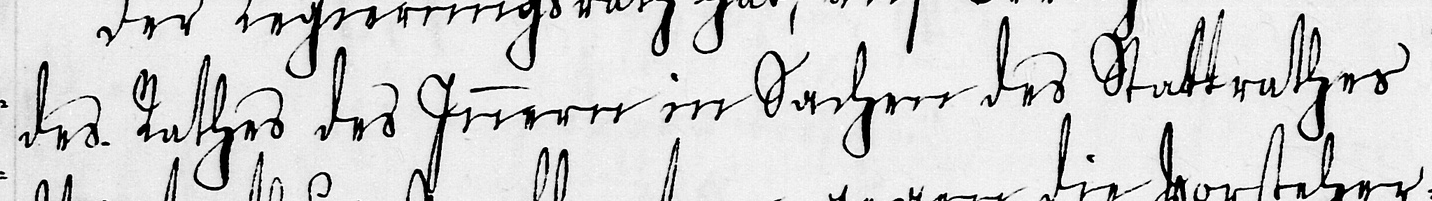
des Rathes des Innern in Sachen des Stadtrathes
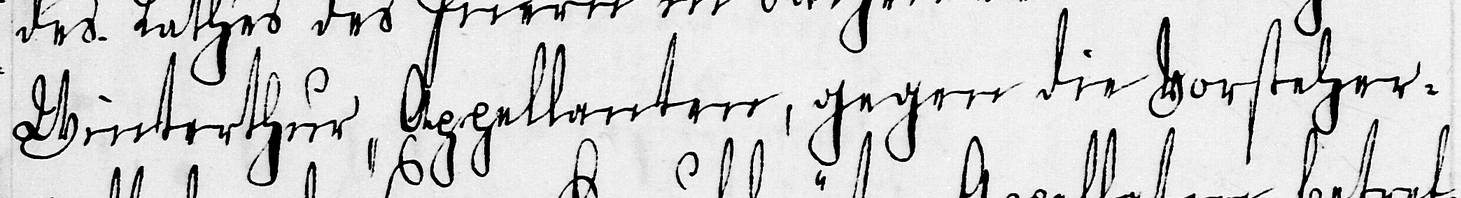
Winterthur, Appellanten, gegen die Vorsteher¬
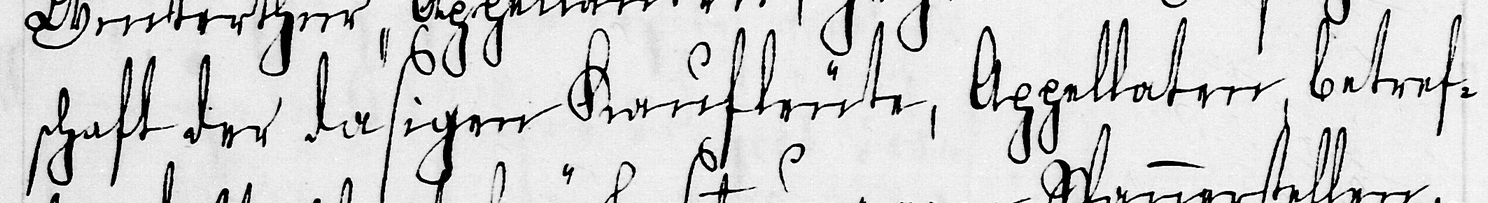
schaft der dasigen Kaufleute, Appellaten, betref¬
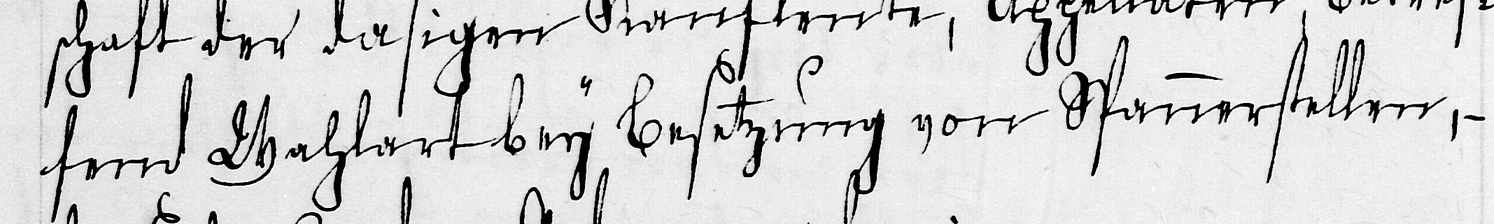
fend Wahlart bey Besetzung von Spannerstellen,
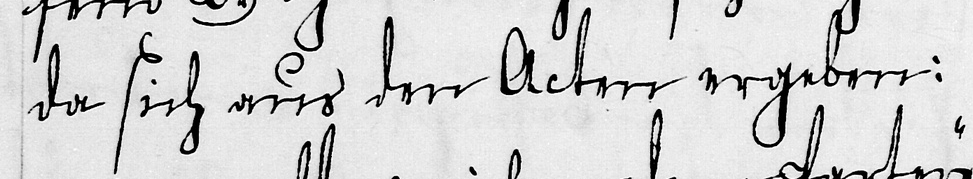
da sich aus den Acten ergeben:
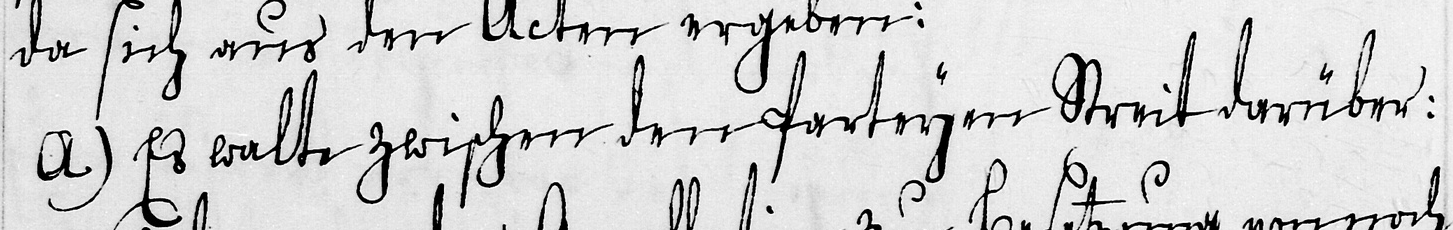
A.) Es walte zwischen den Parteyen Streit darüber:
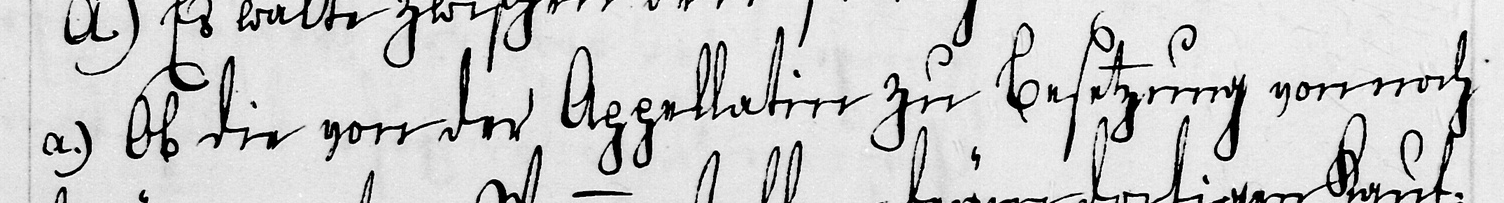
a.) Ob die von der Appellatin zu Besetzung von noch
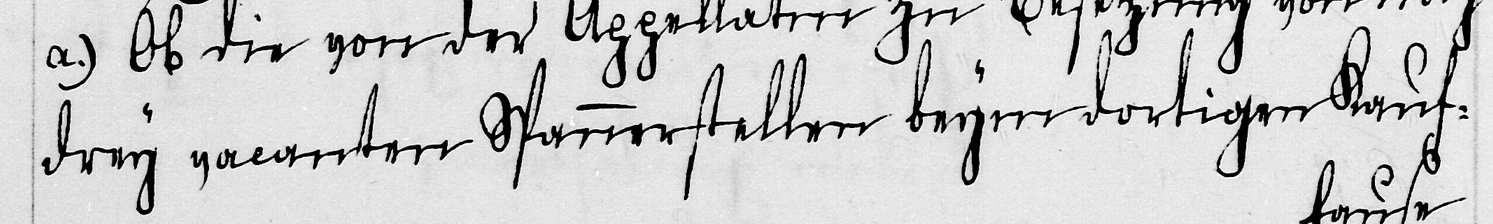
drey vacanten Spannerstellen beym dortigen Kauf-
